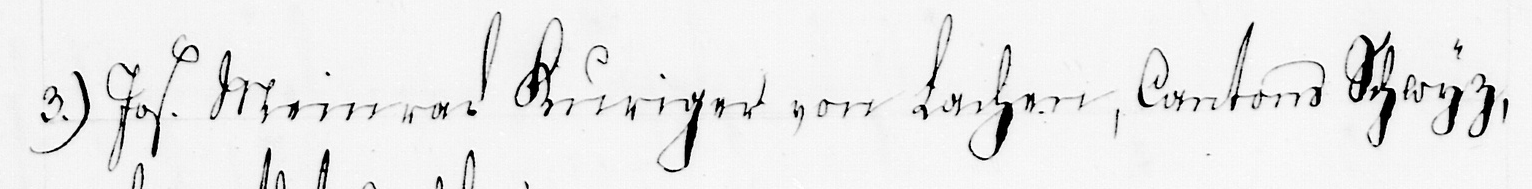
3.) Jos. Meinrad Kuriger von Lachen, Cantons Schwyz,
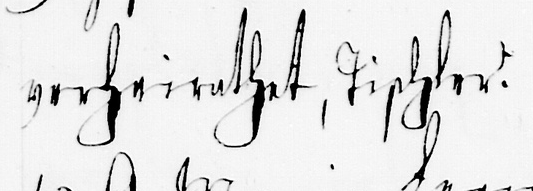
verheirathet, Tischle¬
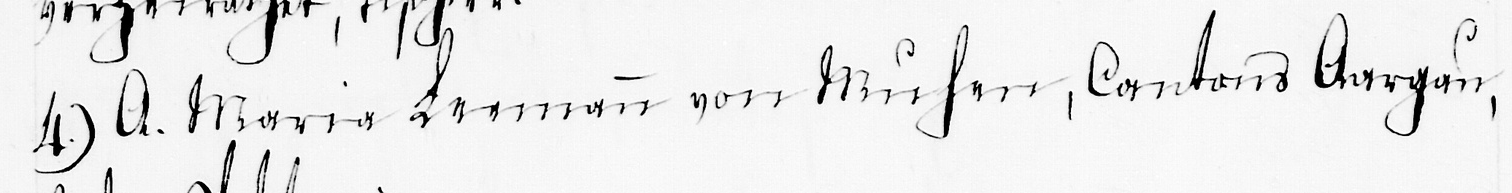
4.) A. Maria Leemann von Muhen, Cantons Aargau,
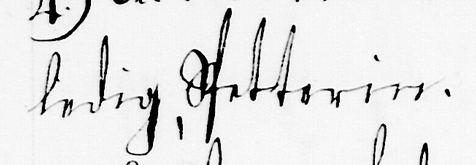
ledig, Spetterin.
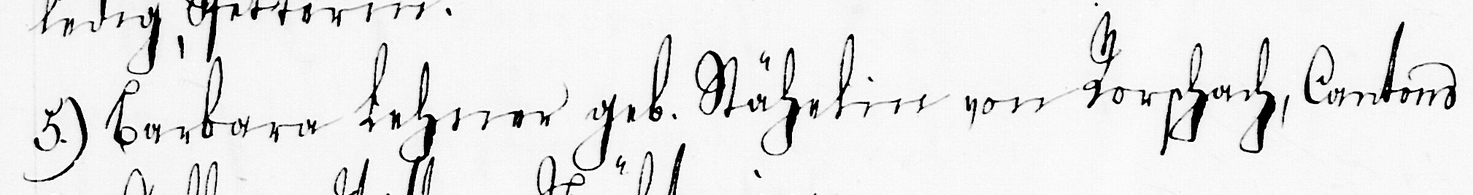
5.) Barbara Lehner geb. Stähelin von Rorschach, Cantons
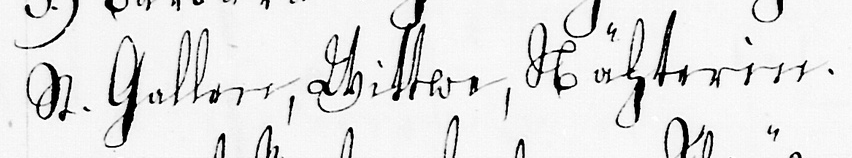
St. Gallen, Wittwe, Nähterin.
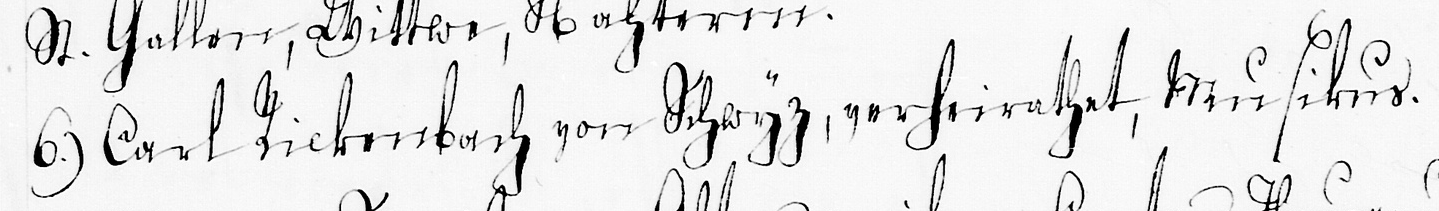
6.) Carl Rickenbach von Schwyz, verheirathet, Musikus.
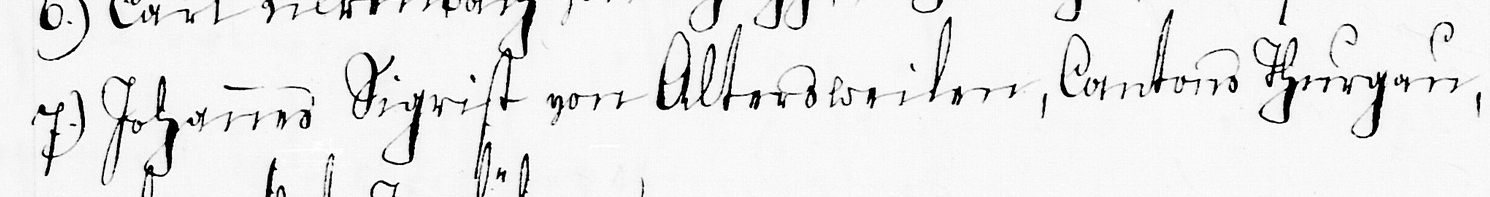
7.) Johannes Sigrist von Altersweilen, Cantons Thurgau,
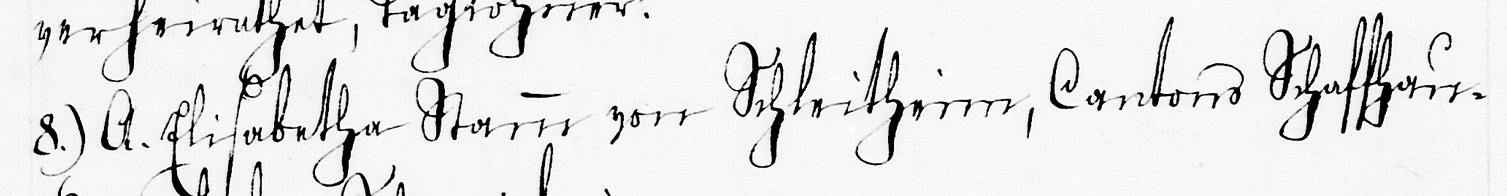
8.) A. Elisabetha Stamm von Schleitheim, Cantons Schaffhau¬
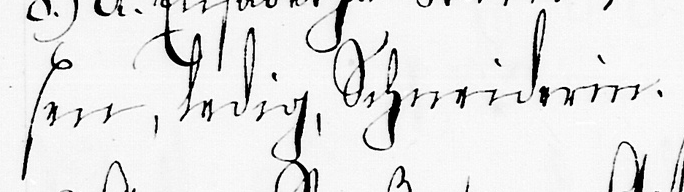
sen, ledig, Schneiderin.
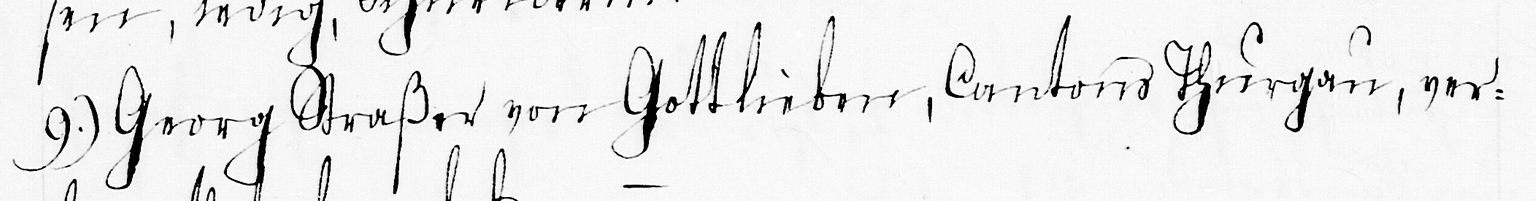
9.) Georg Straßer von Gottlieben, Cantons Thurgau, ver¬
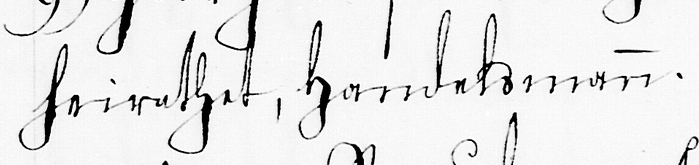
heirathet, Handelsmann.
